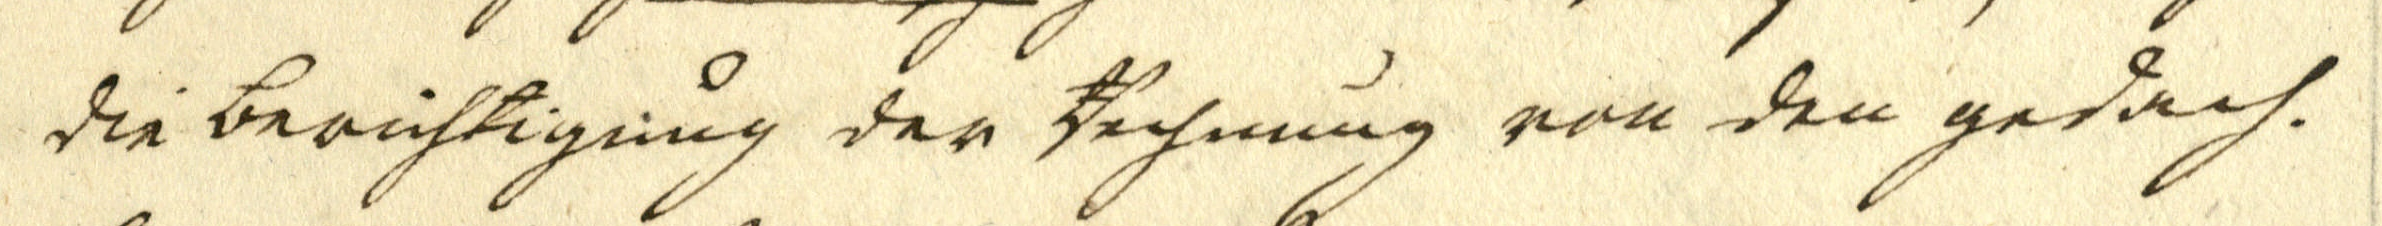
die Berichtigung der Rehnung von den gedach¬
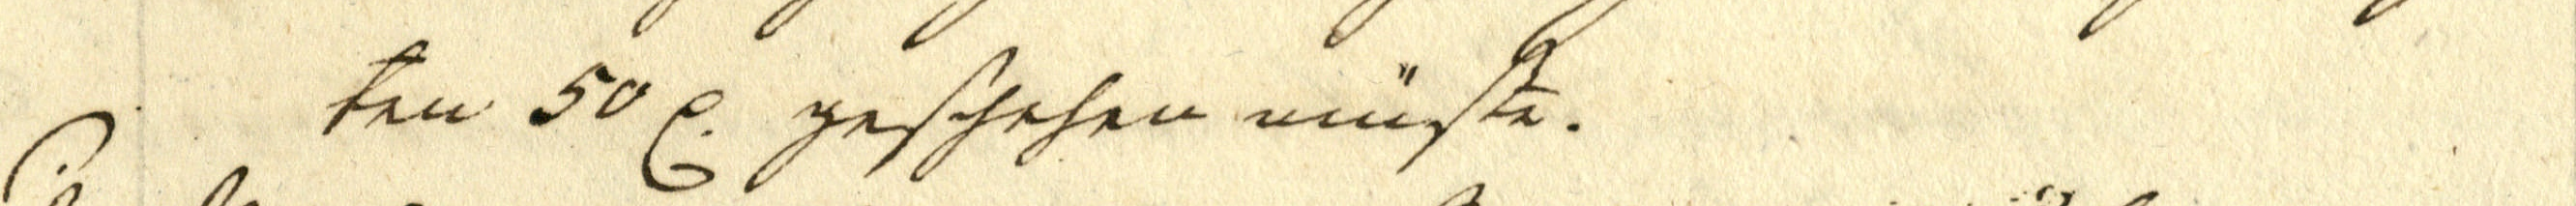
ten 50 l. geschehen müste.
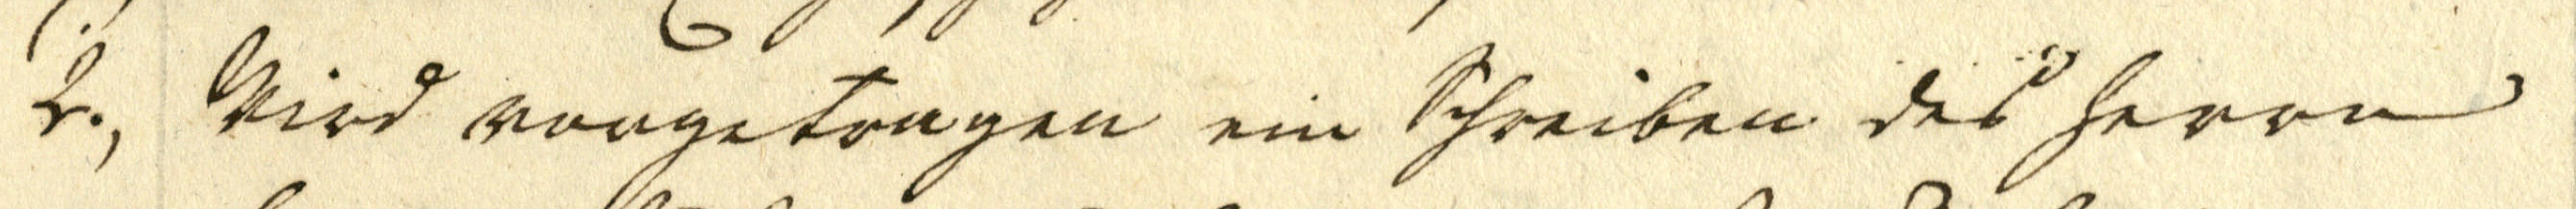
2., Wird vorgetragen ein Schreiben des herrn
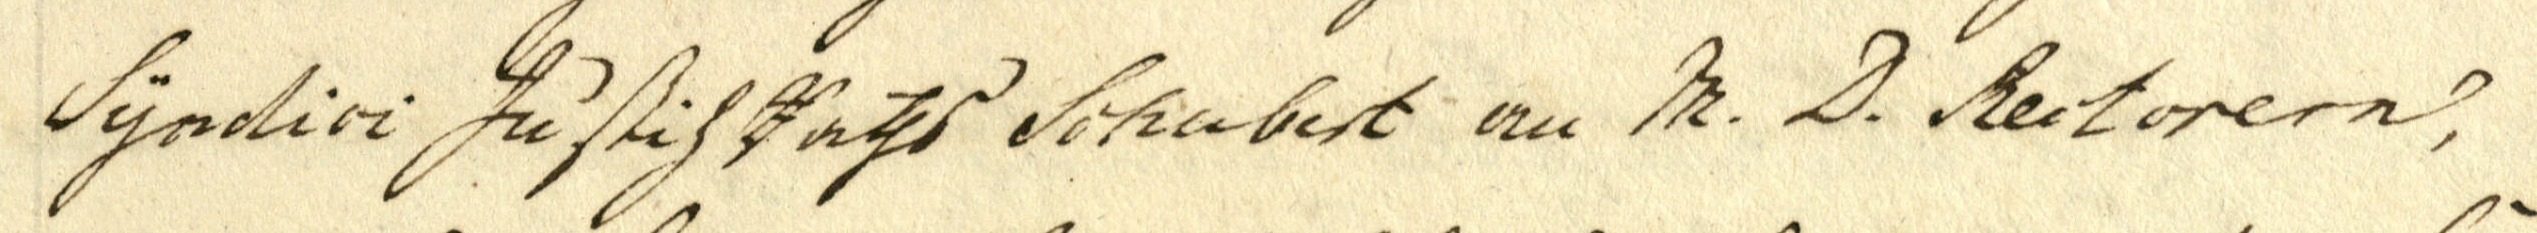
Sÿndici Justiz Raths Schubert an M. D. Rectorem,
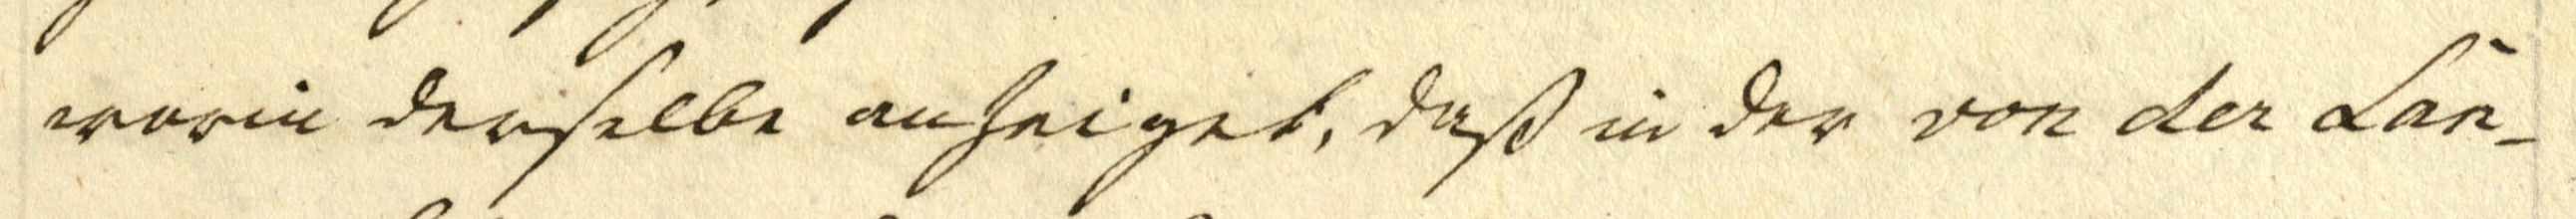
worin derselbe aufzeiget, daß in der von der Lan¬
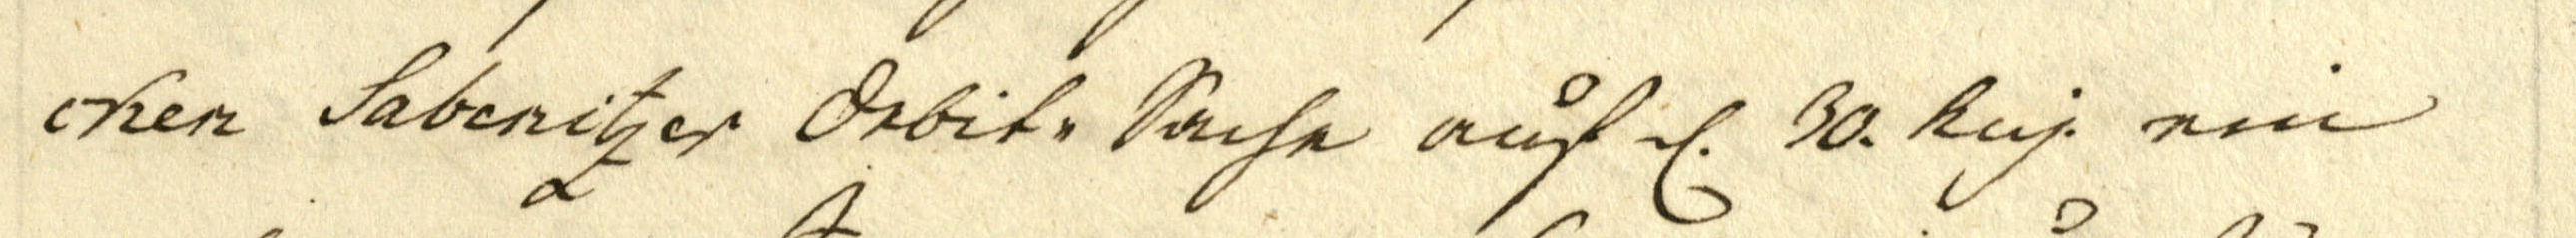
cken Sabenitzer Debit-Sache auf l. 30. huj. ein
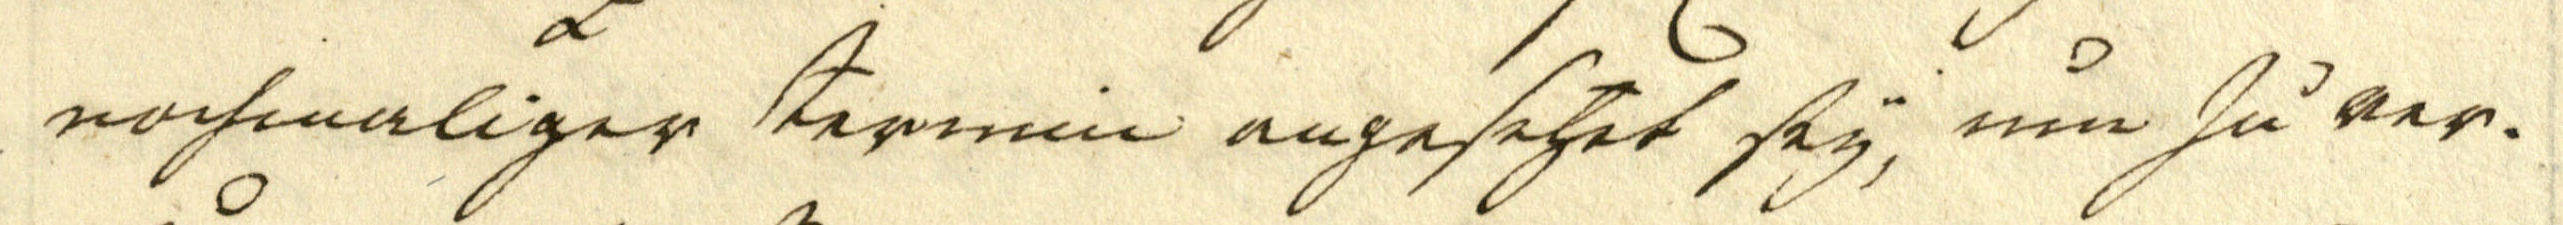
nochmaliger Termin angesetzet seÿ, um zu ver¬
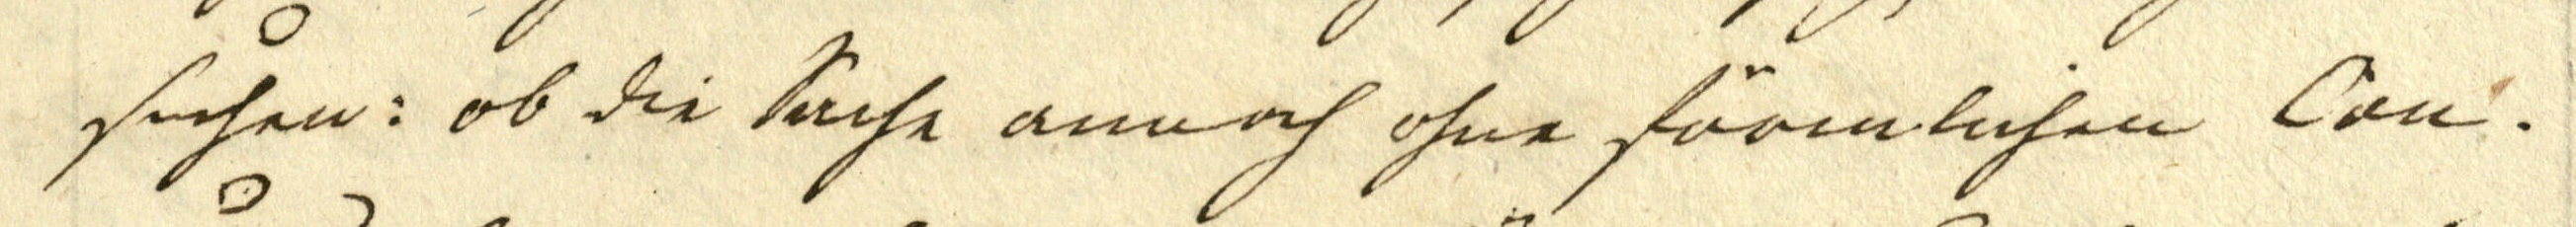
suchen: ob die Sache annoch ohne förmlichen Con¬
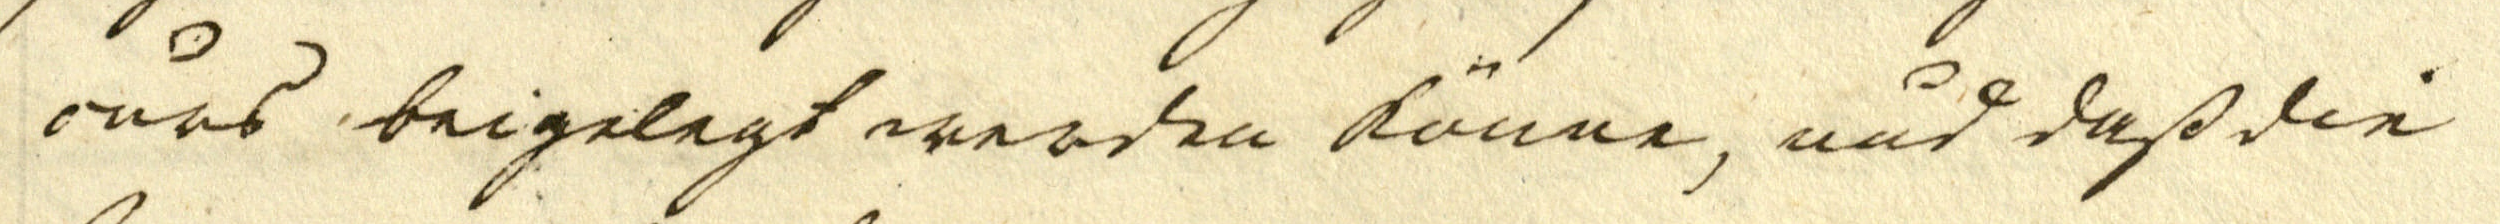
curs beigelegt werden könne, und daß die
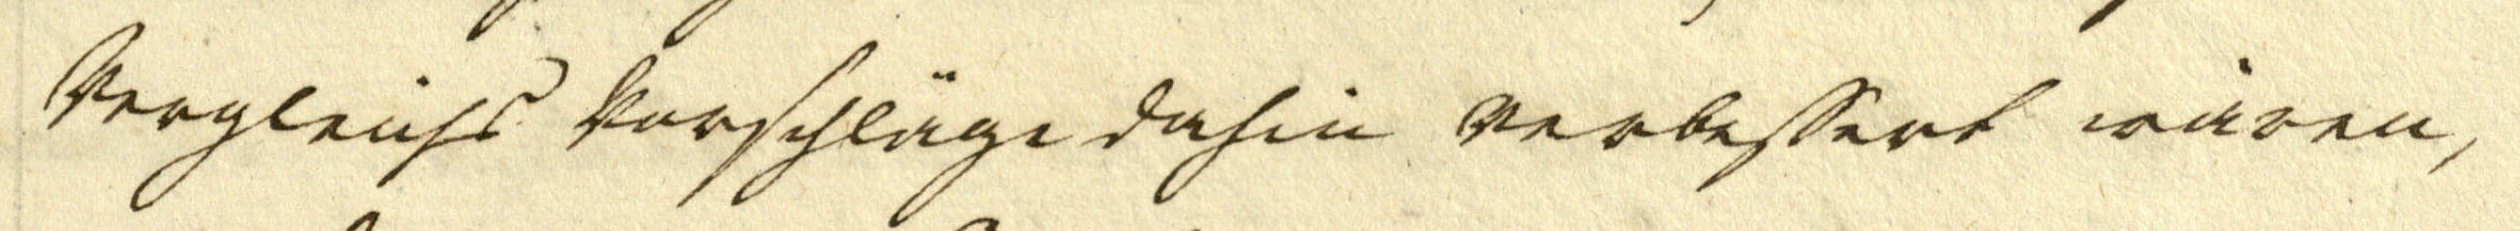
Vergleichs Vorschläge dahin verbessert wären,
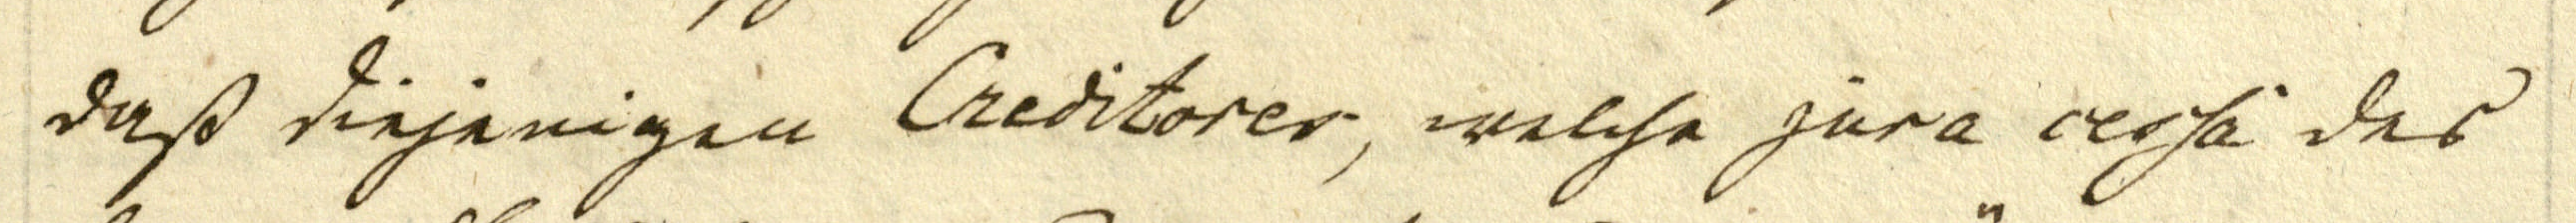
daß diejenigen Creditores, welche jura cessa des
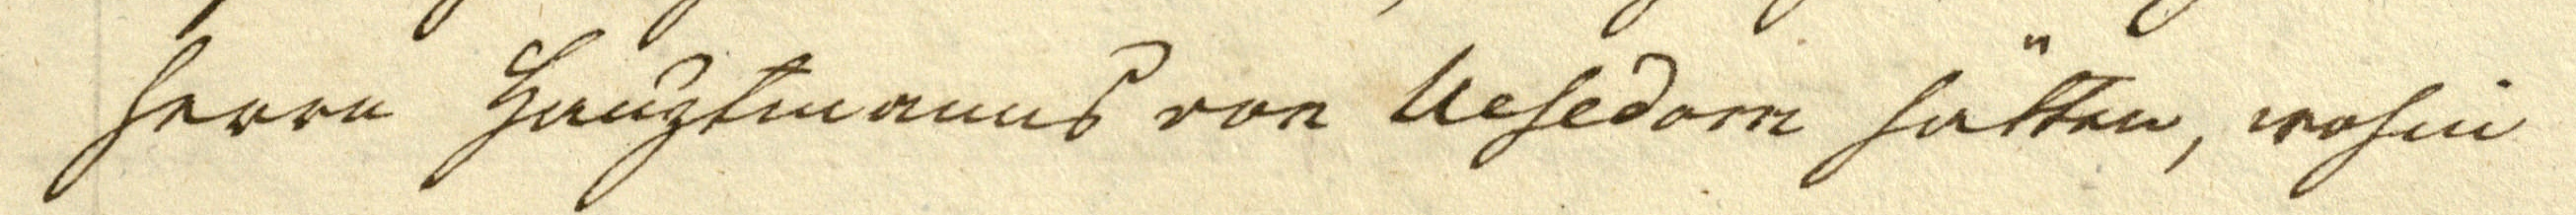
herrn Hauptmanns von Usedom hätten, wohin
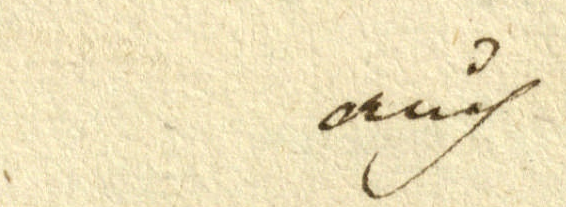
auch
